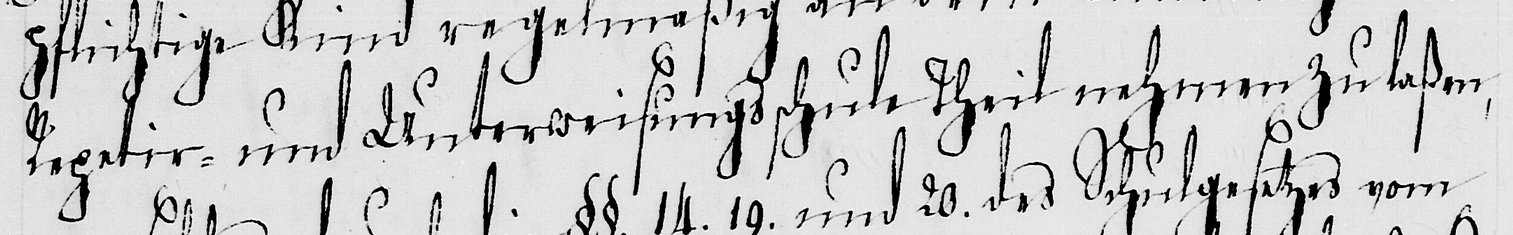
Repetir- und Unterweisungsschule Theil nehmen zu laßen,
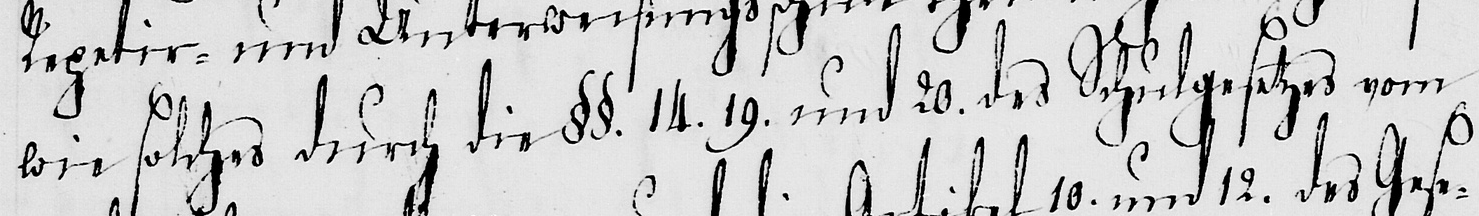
wie solches durch die §§. 14. 19. und 20. des Schulgesetzes vom
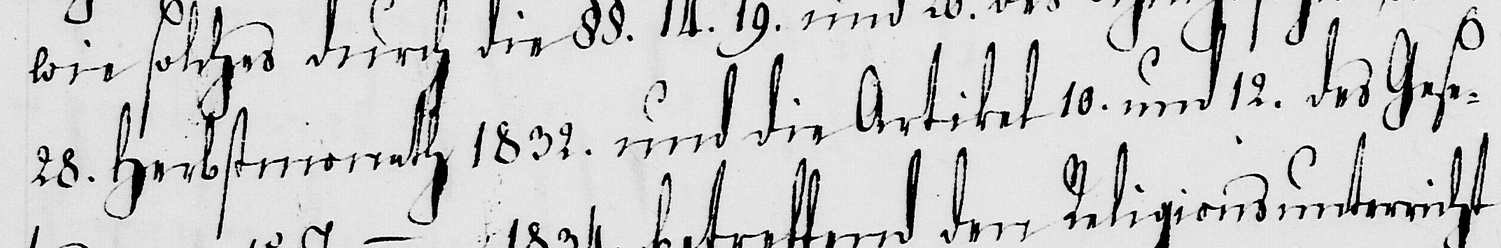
28. Herbstmonath 1832. und die Artikel 10. und 12. des Gese¬
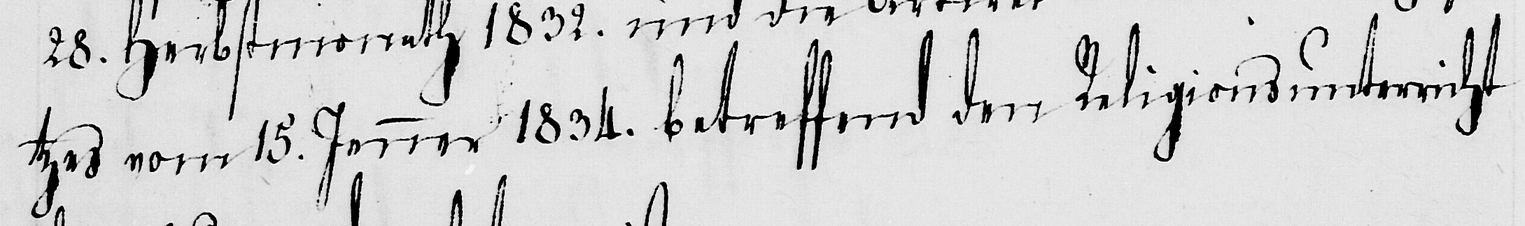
tzes vom 15. Jenner 1834. betreffend den Religionsunterricht
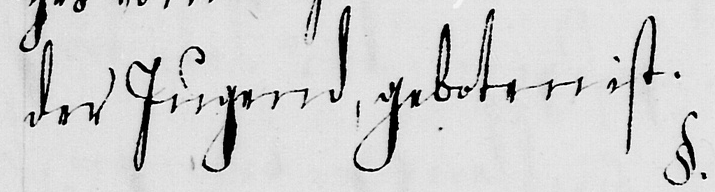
der Jugend, geboten ist.
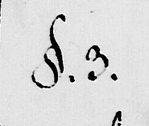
§. 3.
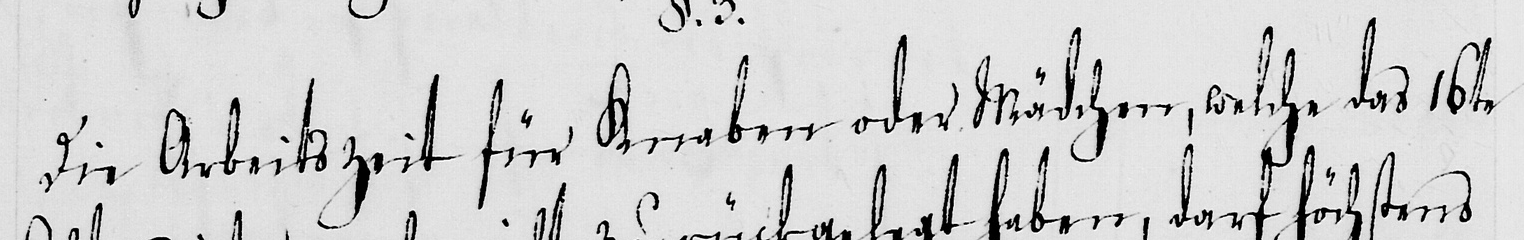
Die Arbeitszeit für Knaben oder Mädchen, welche das 16te
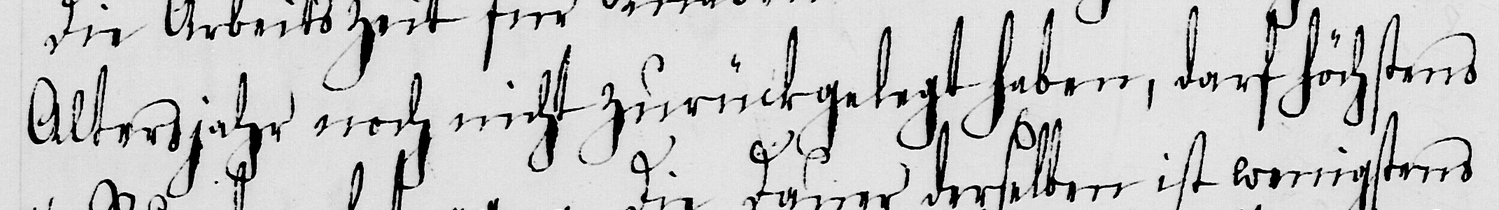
Altersjahr noch nicht zurückgelegt haben, darf höchstens
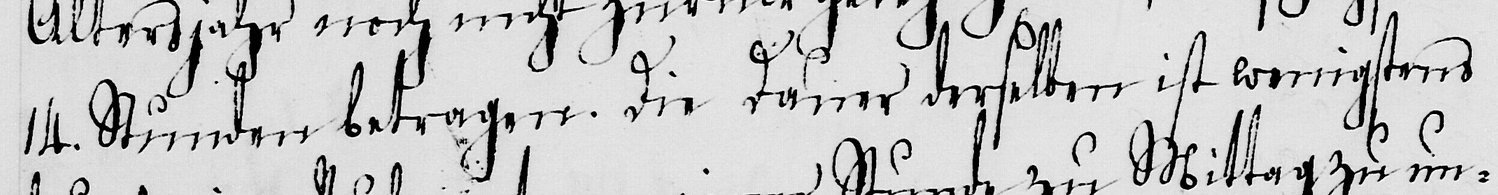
14. Stunden betragen. Die Dauer derselben ist wenigstens
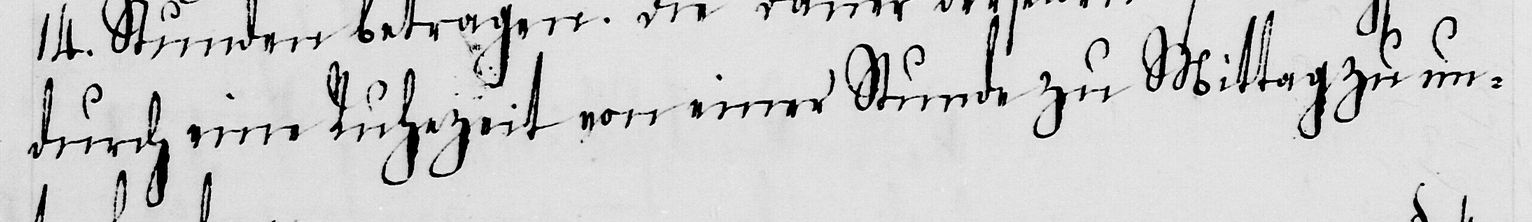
durch eine Ruhezeit von einer Stunde zu Mittag zu un¬
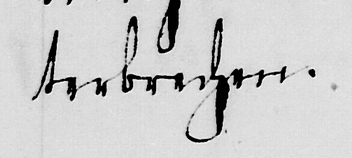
terbrechen.
